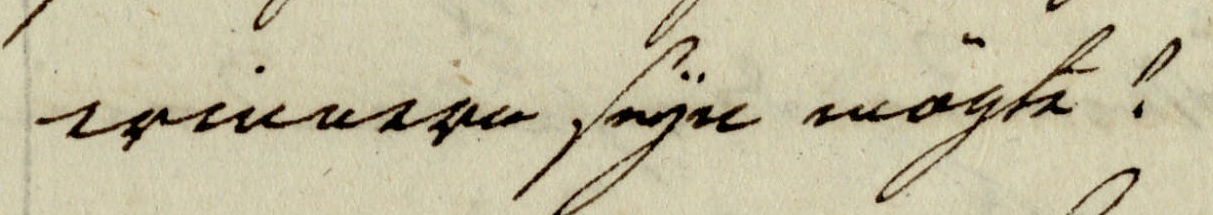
erinnern seÿn möchte?
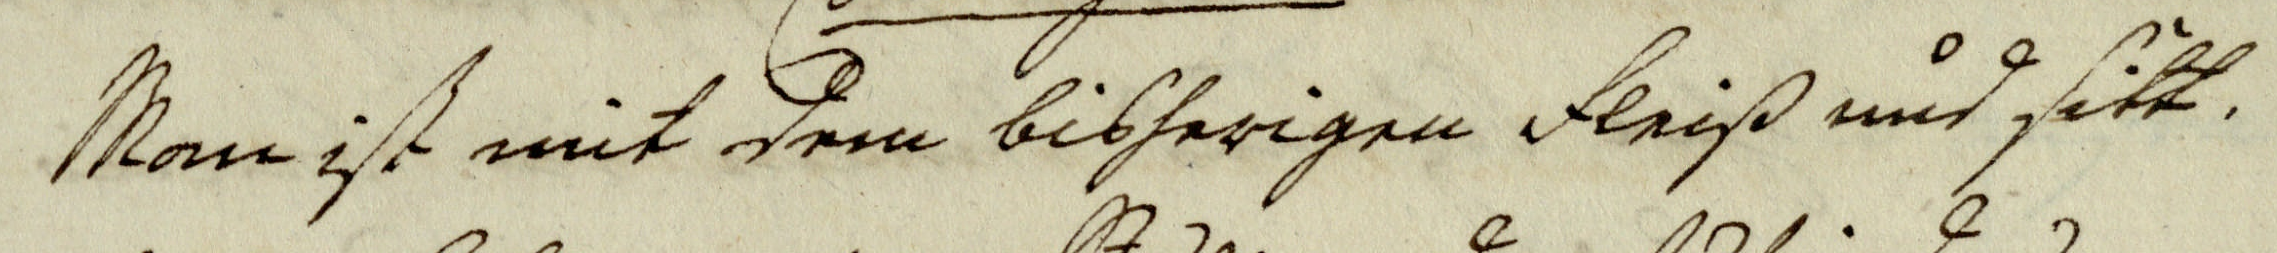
Man ist mit dem bisherigen Fleiß und sitt¬
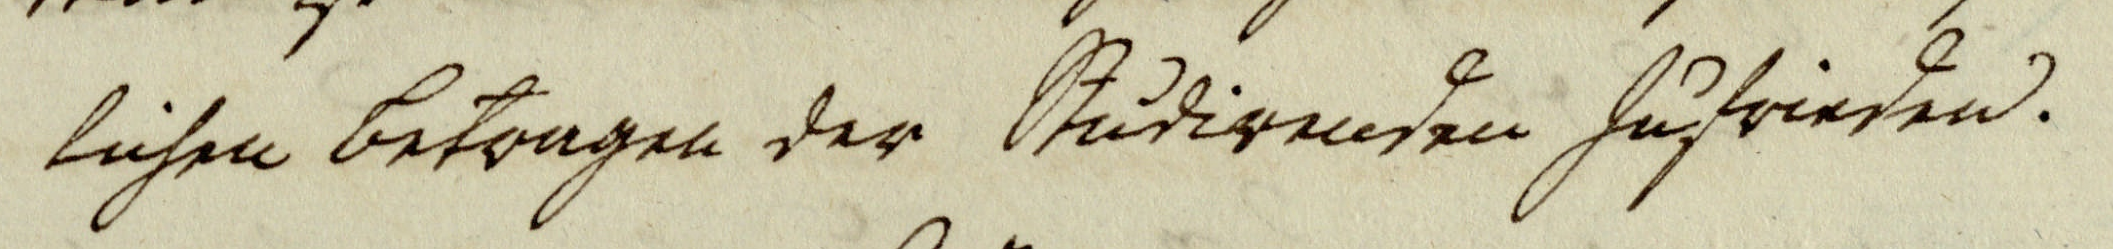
lichen Betragen der Studirenden zufrieden.
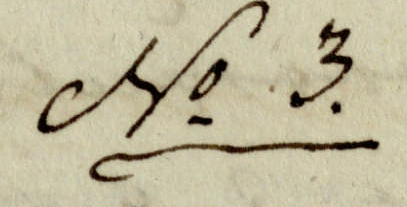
No 3.
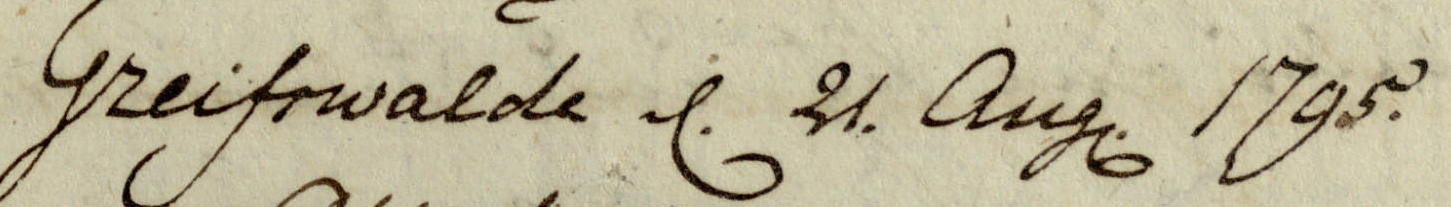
Greifswalde d. 21. Aug. 1795.
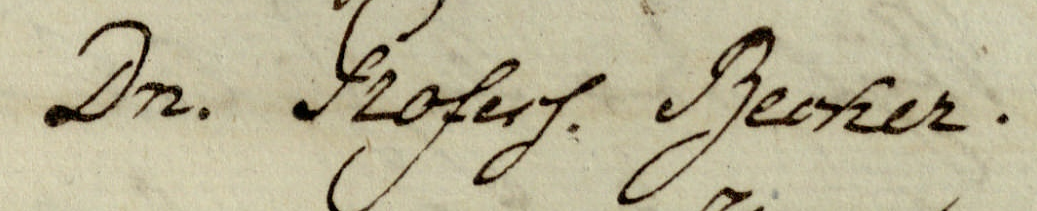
Dn. Profess. Becher.
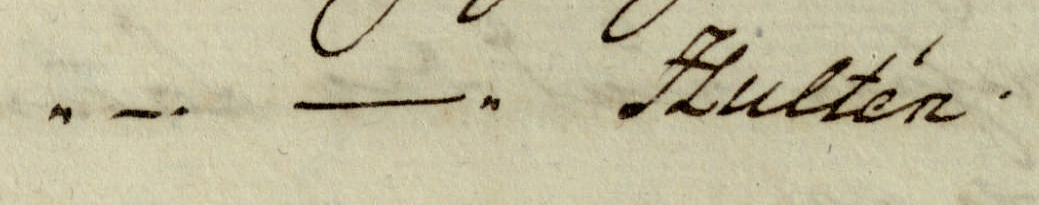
" — . — " Hultén.
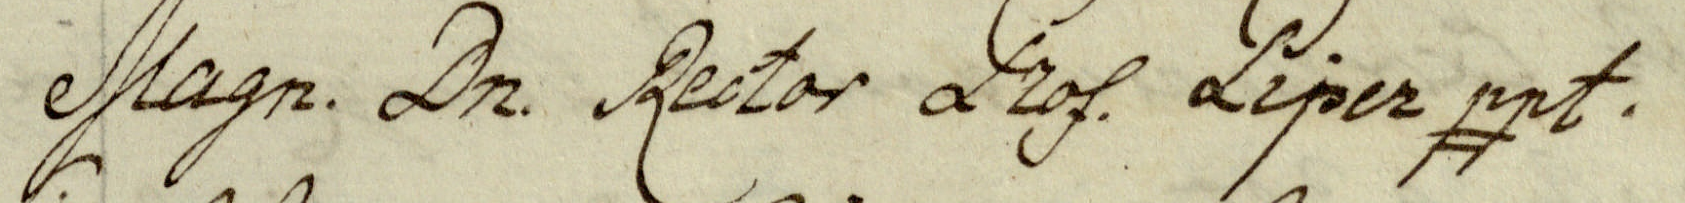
Magn. Dn. Rector Prof. Piper ppt.
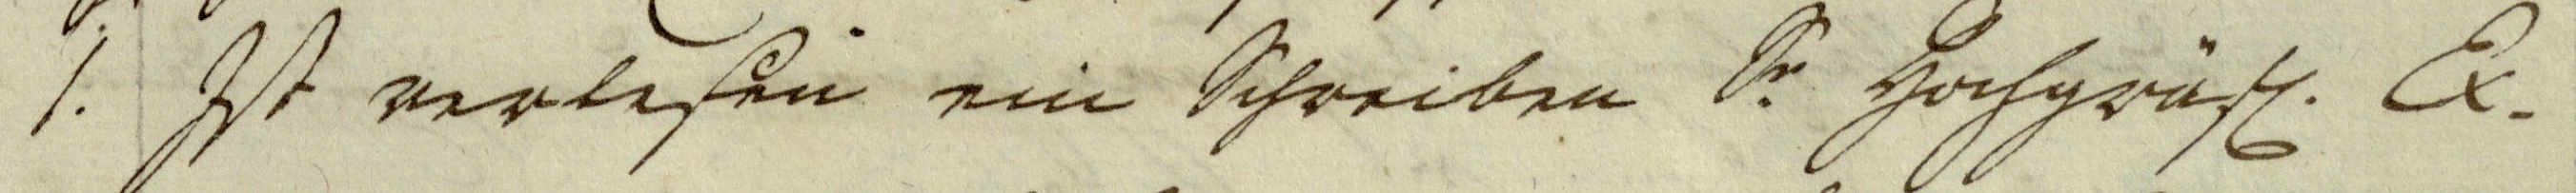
1. Ist verlesen ein Schreiben Sr. Hochgräfl. Ex¬
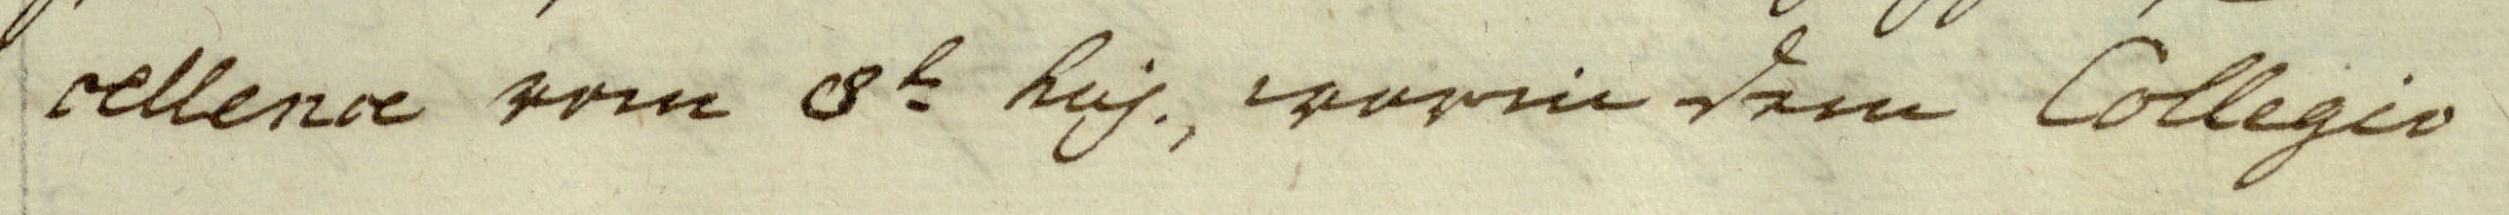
cellence vom 8. huj., worin dem Collegio
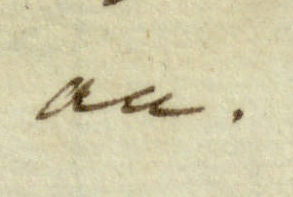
an.
